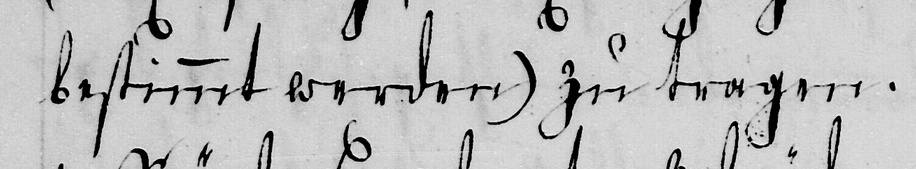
bestimmt werden) zu tragen.
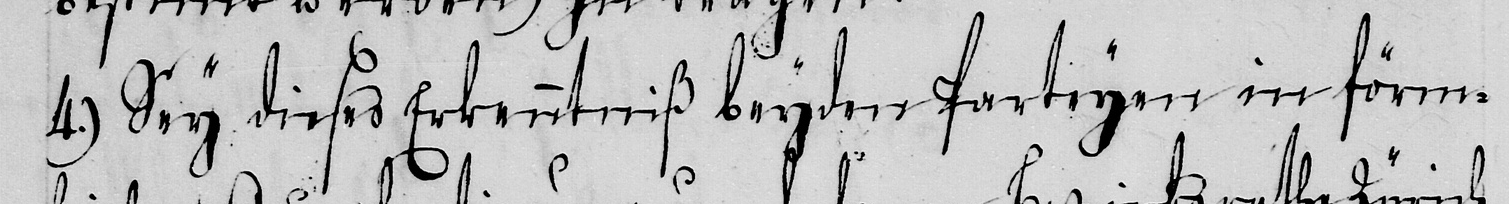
4.) Sey dieses Erkenntniß beyden Parteyen in förm¬
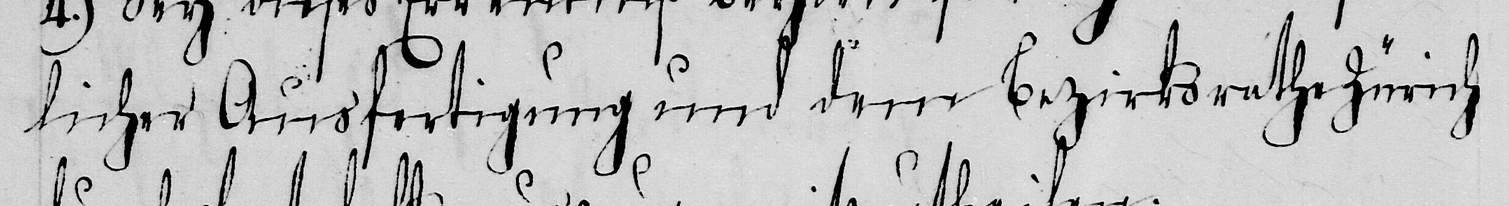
licher Ausfertigung und dem Bezirksrathe Zürich
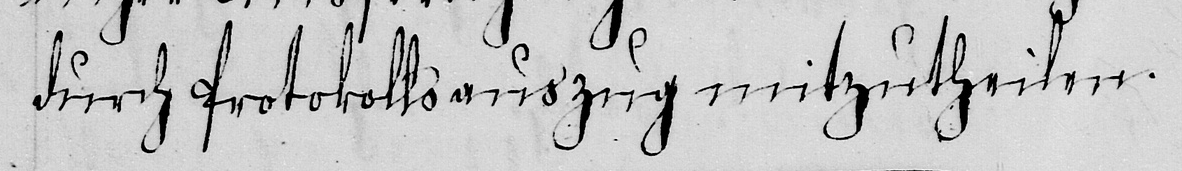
durch Protokollsauszug mitzutheilen.
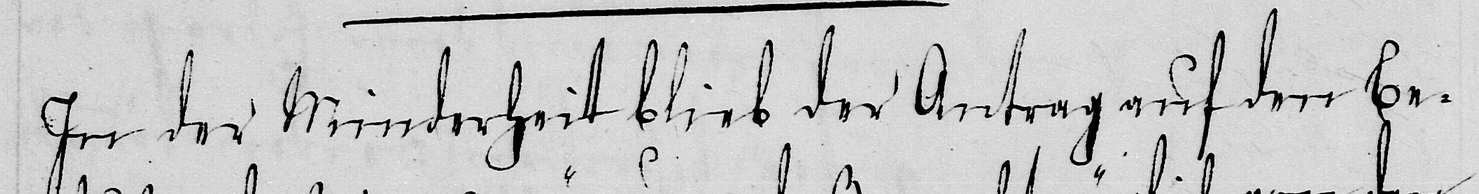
In der Minderheit blieb der Antrag auf den Be¬
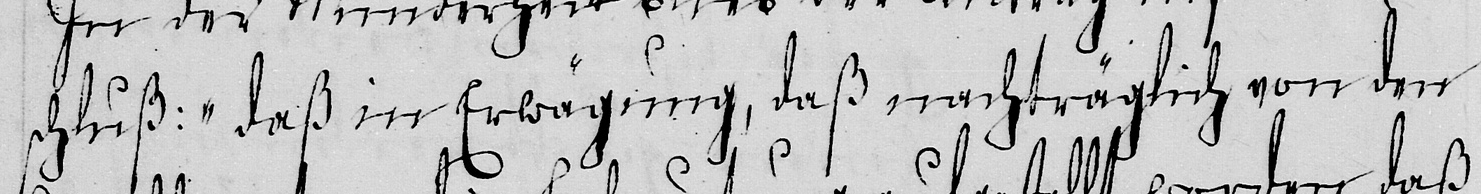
schluß: „daß in Erwägung, daß nachträglich von den
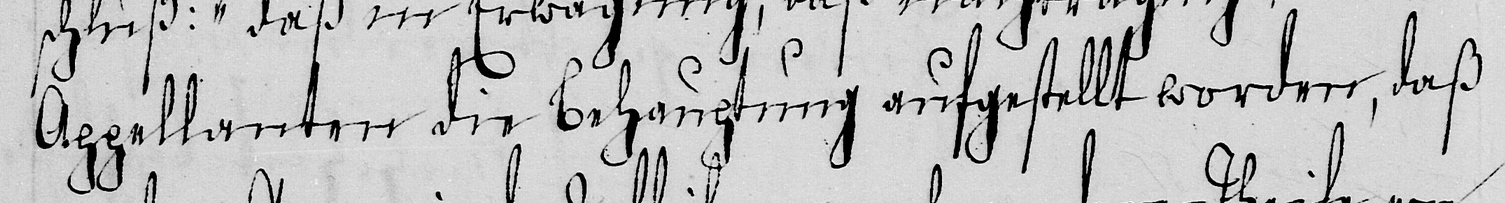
Appellanten die Behauptung aufgestellt worden, daß
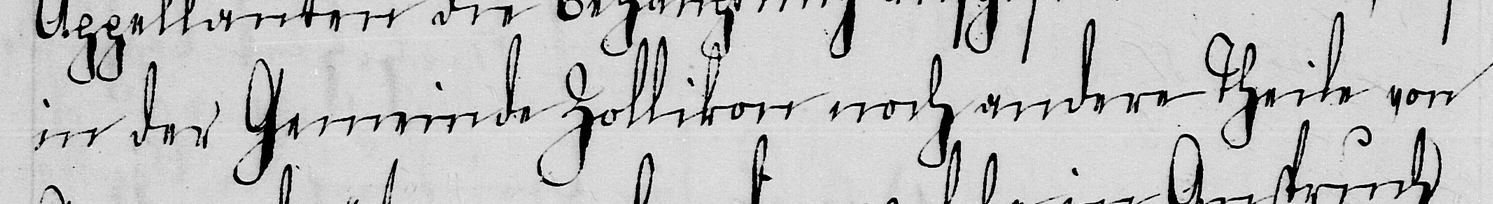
in der Gemeinde Zollikon noch andere Theile von
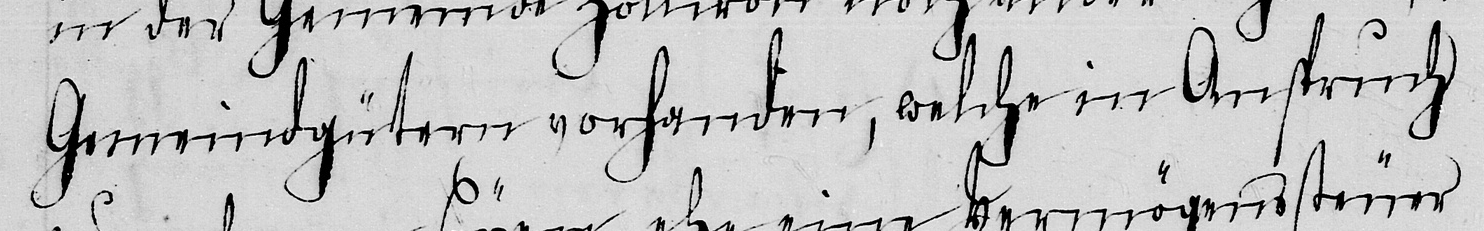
Gemeindgütern vorhanden, welche in Anspruch
